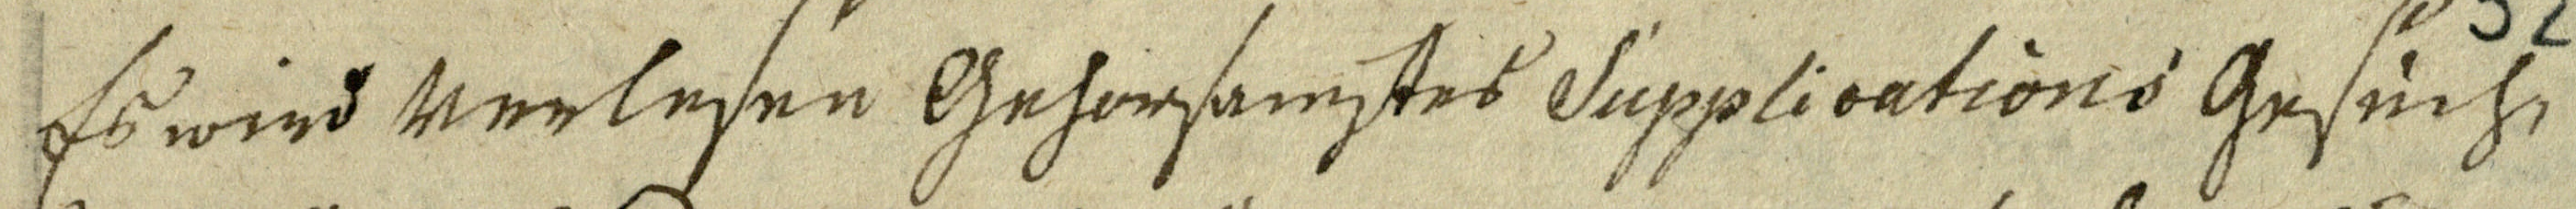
3. Es wird verlesen gehorsamstes Supplications Gesuch,
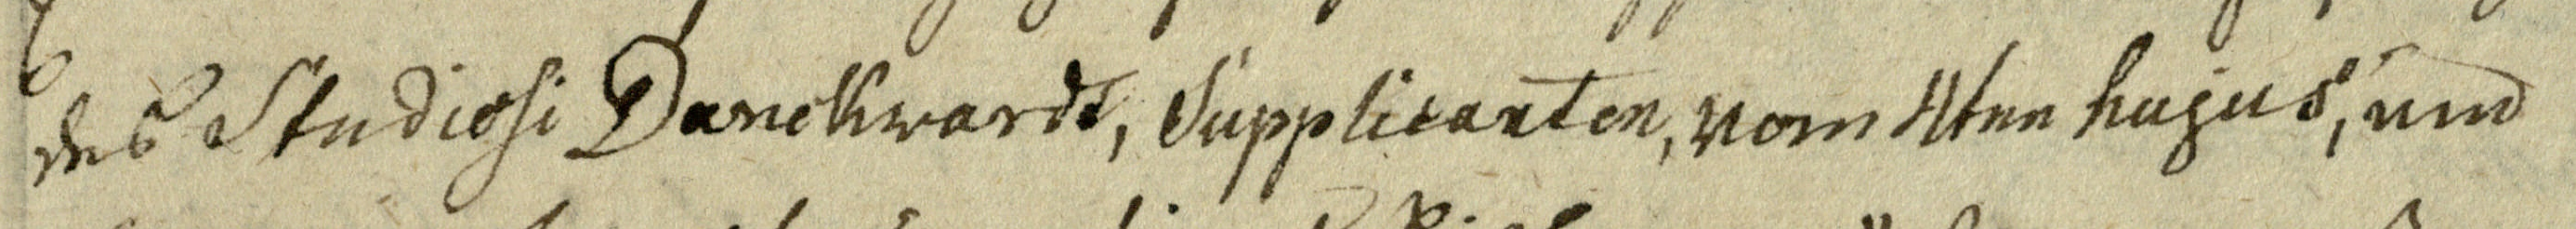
des Studiosi Danckwardt, Supplicanten, vom 4 ten hujus, um
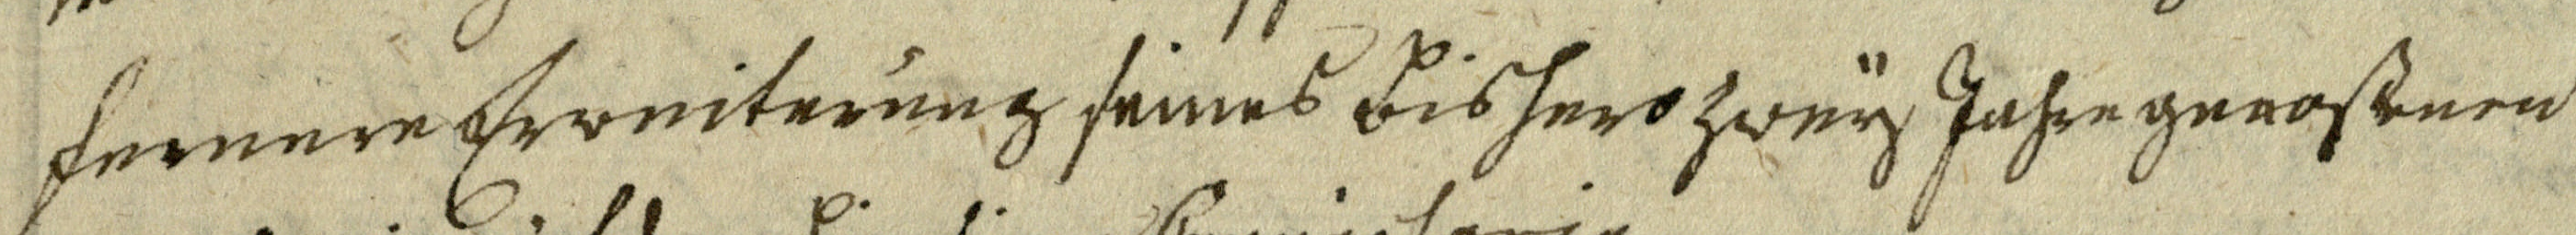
fernere Erweiterungseines bishero zweÿ jahre genoßenen
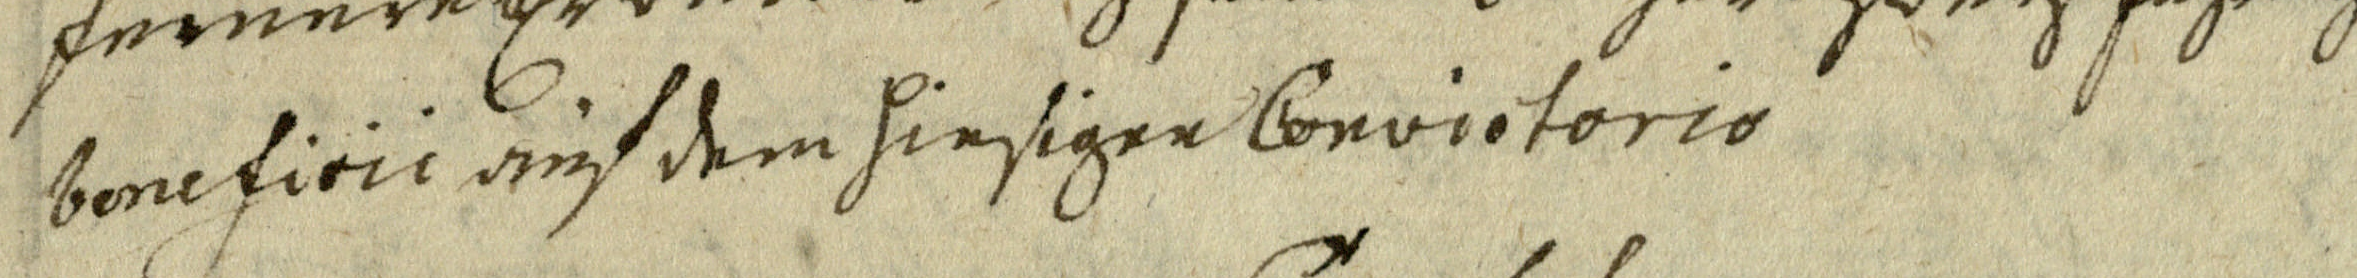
beneficiii auf dem hiesigen Convictorio
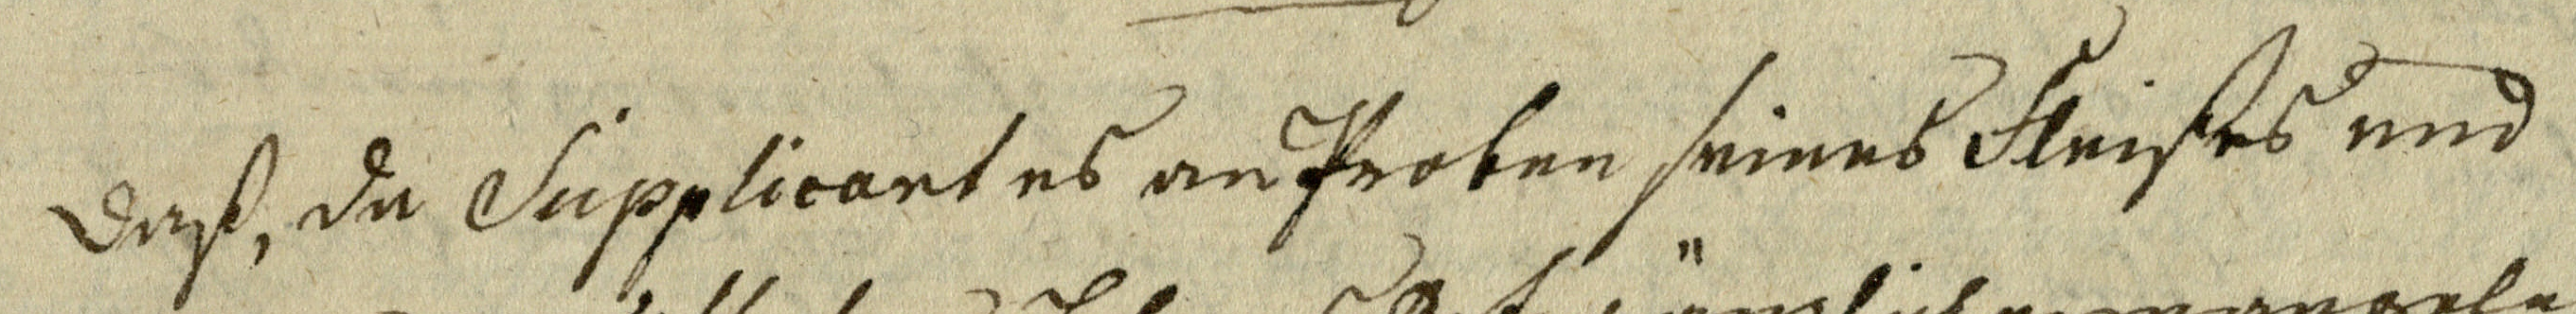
daß, da Supplicant es an Proben seines Fleißes und
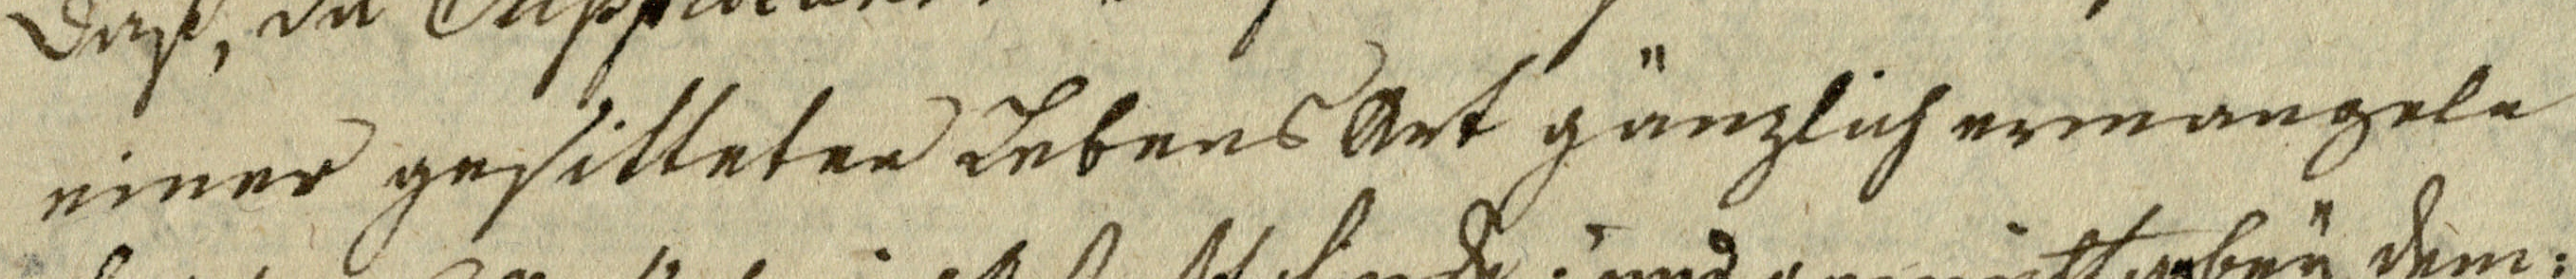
einer gesitteten Lebens Art gänzlich ermangeln
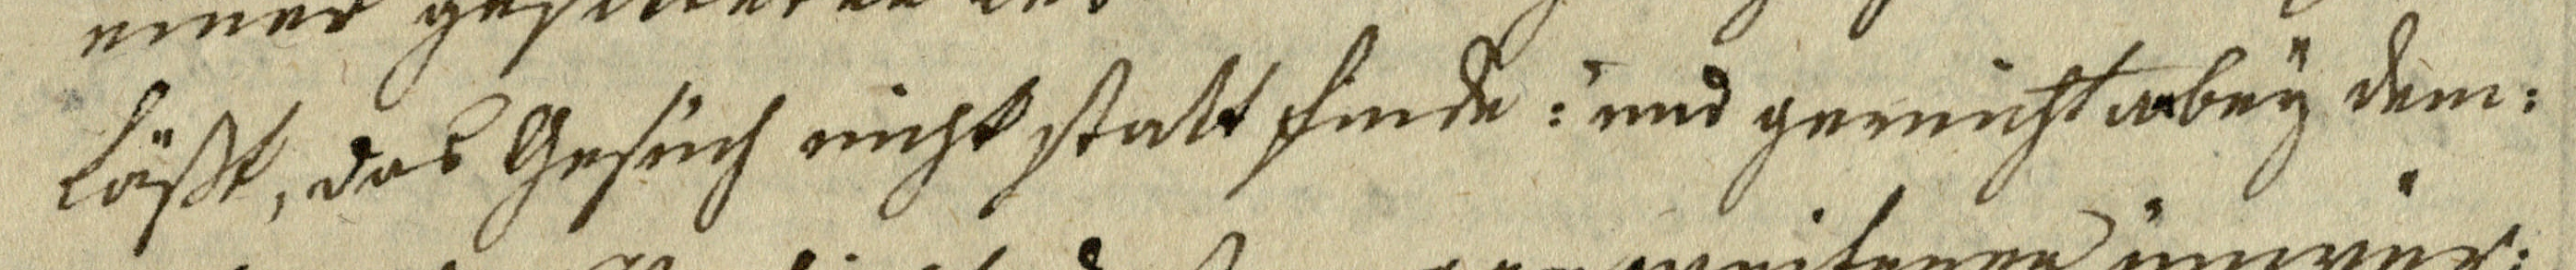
läßt, das Gesuch nicht statt finde und greicht dabeÿ dem¬
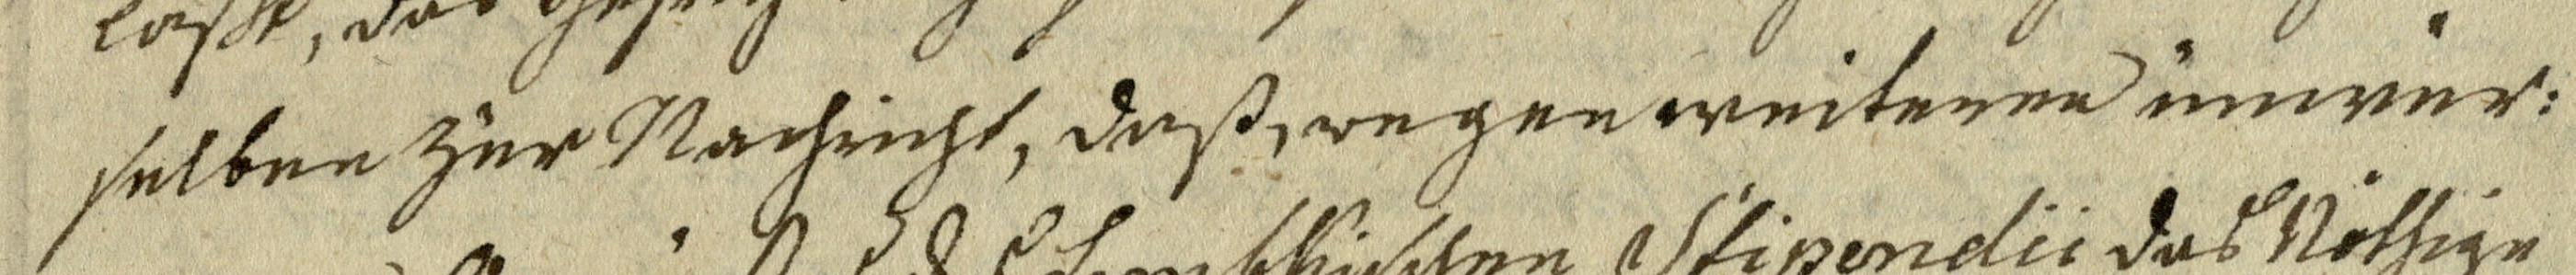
selben zur Nachricht, daß, wegen weiteren unwür¬
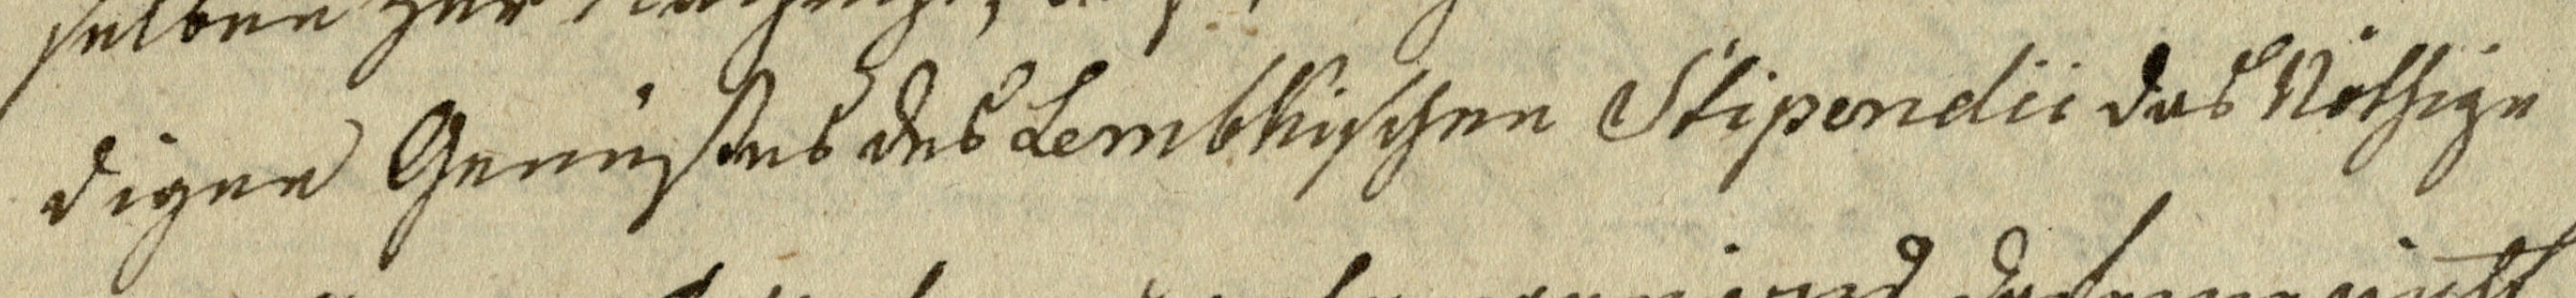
digen Genußes des Lembkischen Stipendii das Nöthige
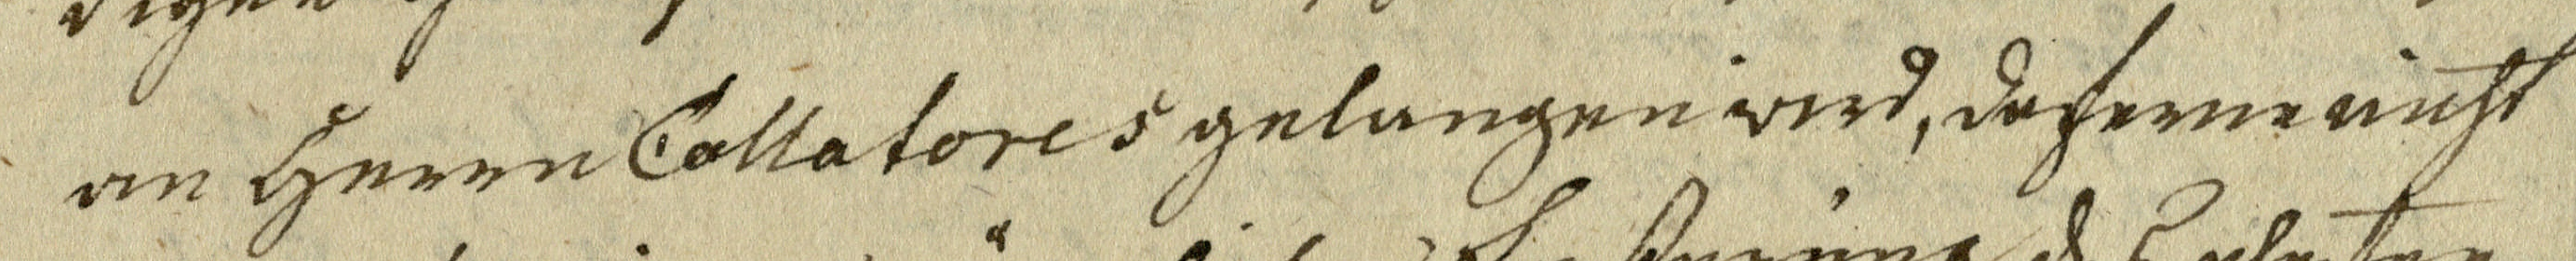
an Herrn Collatores gelangen wird, daferne nicht
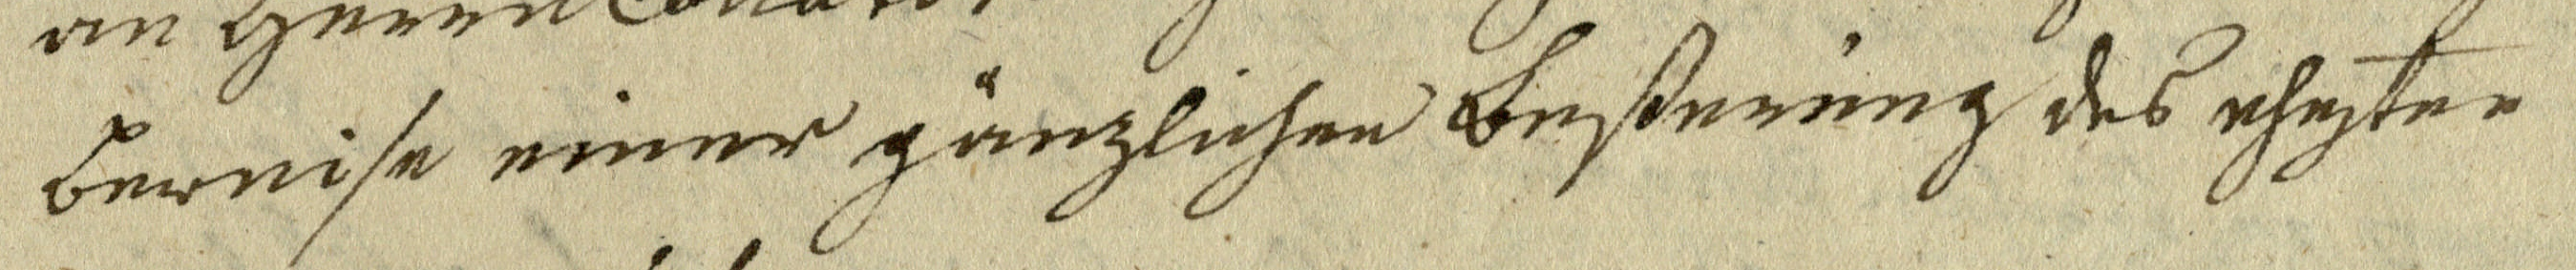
Beweise einer gänzlichen Besserung des ehesten
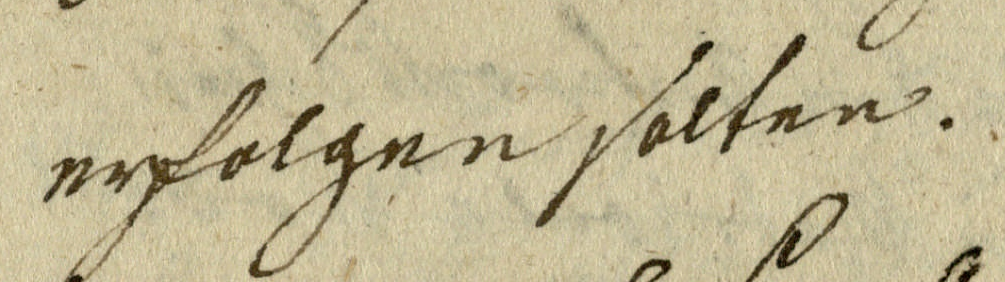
erfolgen solten.
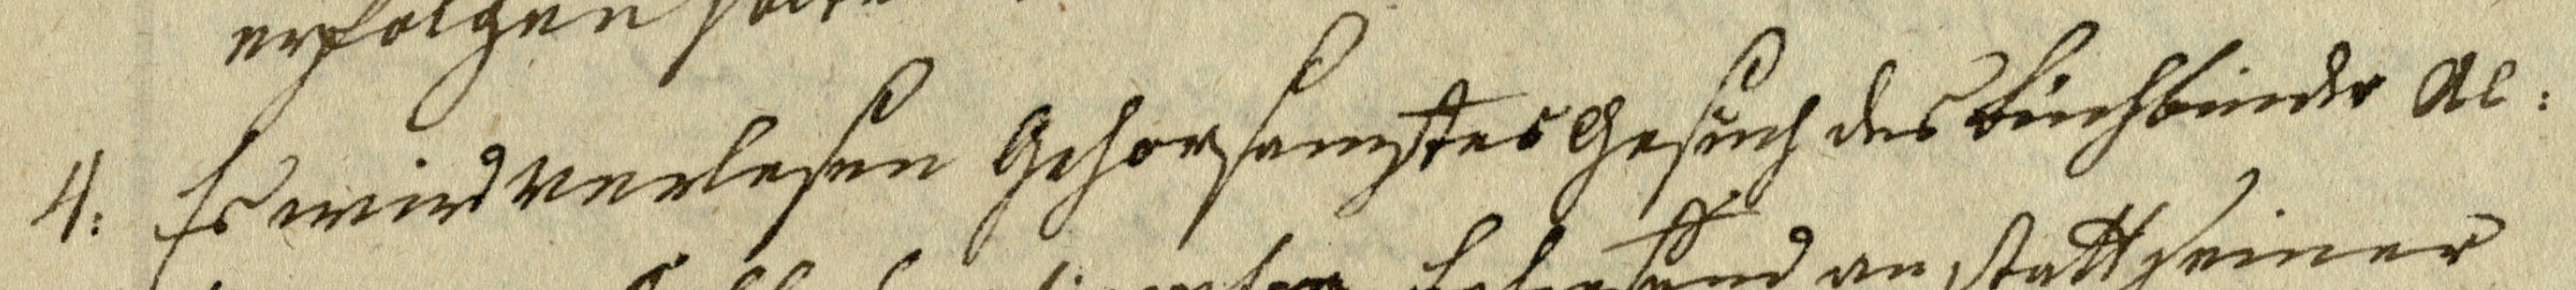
4. Es wird verlesen gehorsamstes Gesuch des Buchbinder Al¬
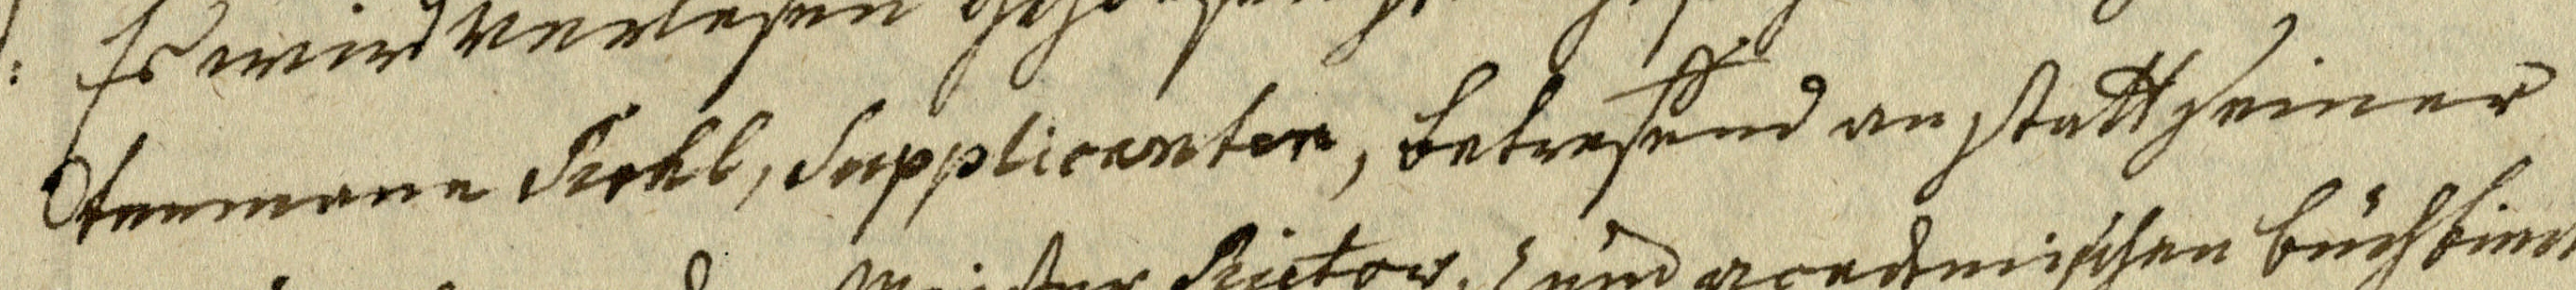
termann Rohl, Supplicanten, betreffend anstatt seiner
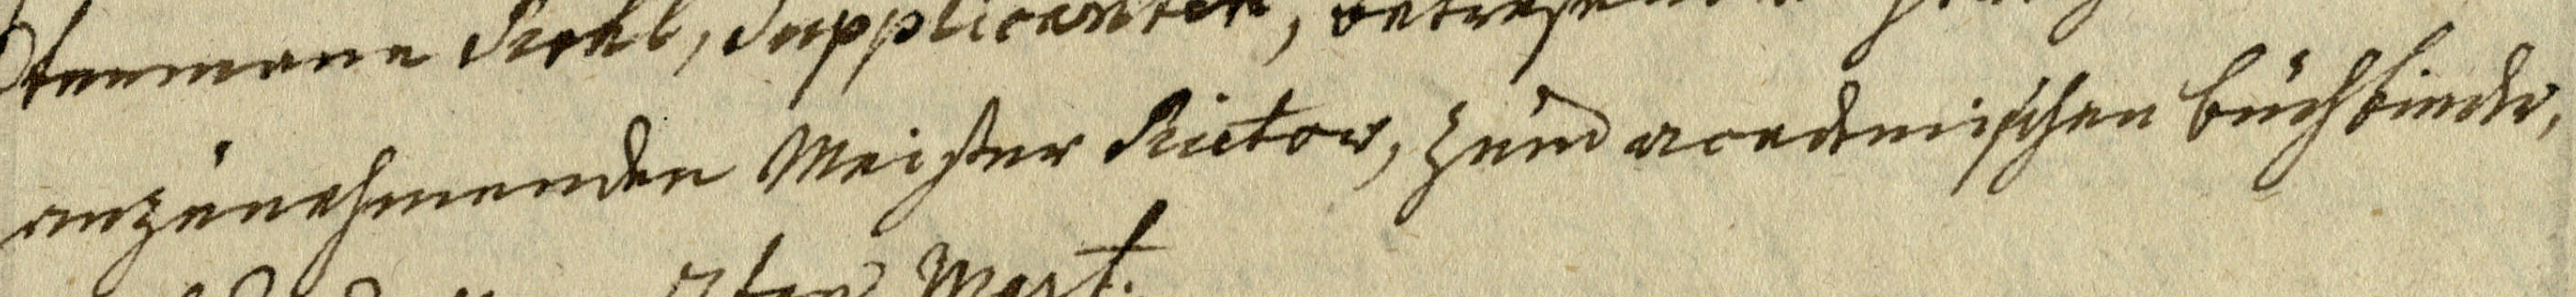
anzunehmen den Meister Rietow zum academischen Buchbinder,
